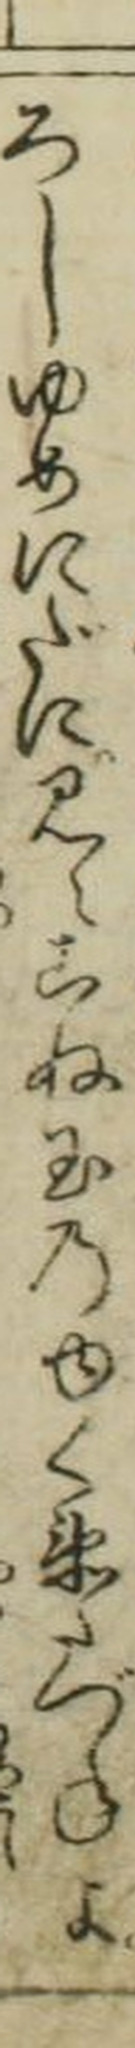ろしゆめにだに。見えこぬ玉のゆくゑたづねよ。
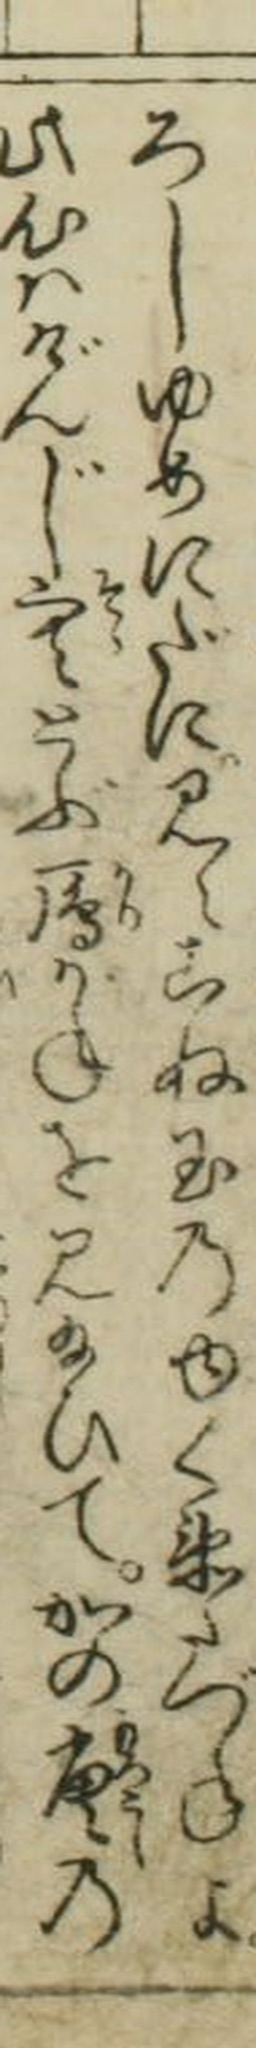此心はげんじ空とぶ雁がねを見給ひて。かの唐の
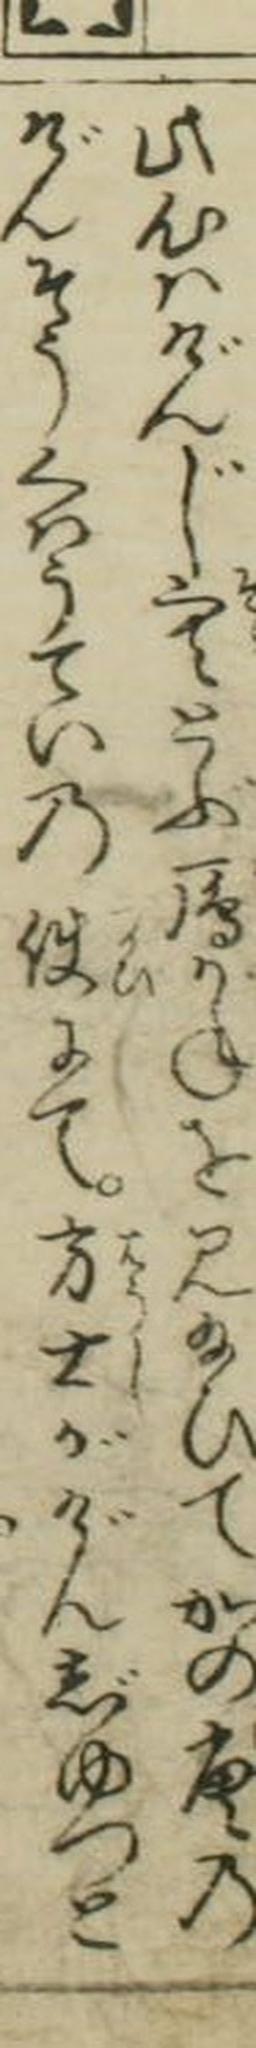げんそうくはうていの使にて。方士がげんじゆつと
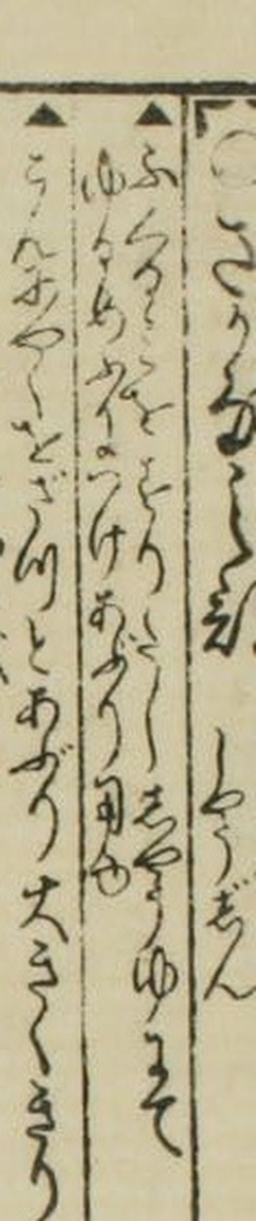▲ふくるみをすりたししやうゆにて
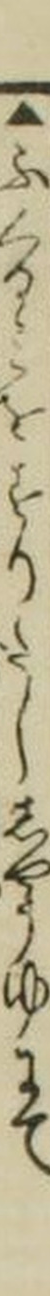▲ふくるみをすりたししやうゆにて
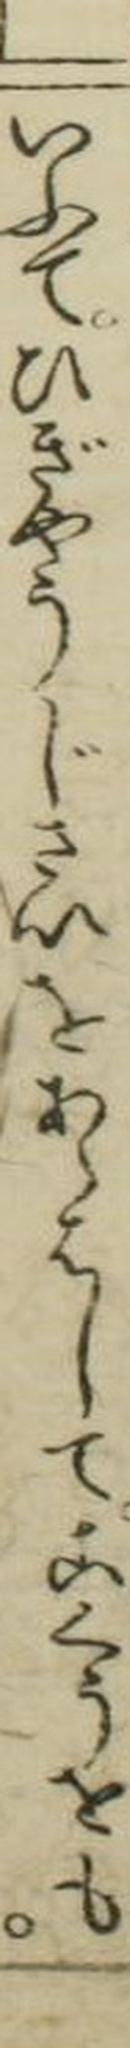いふて。ひぎやうじさいをあらはして。こくうをも
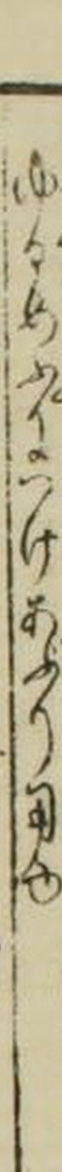ゆるめふにつけあぶり用ゆ
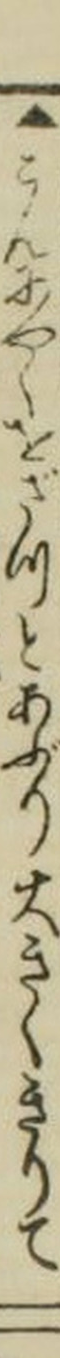▲こんにやくをざつとあぶり大きくきりて
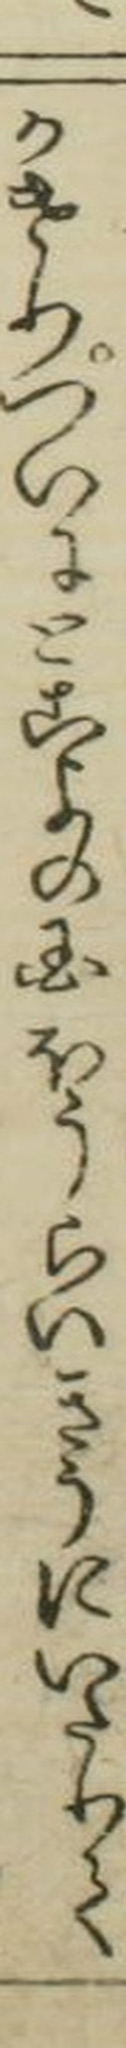かけり。ついにとこよの国ほうらいきうにいたりて。
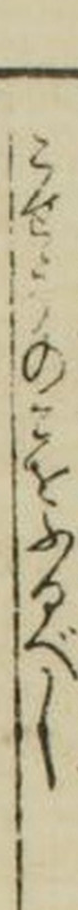こせうのこをふるべし
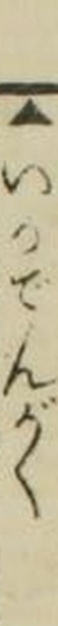▲いかでんがく
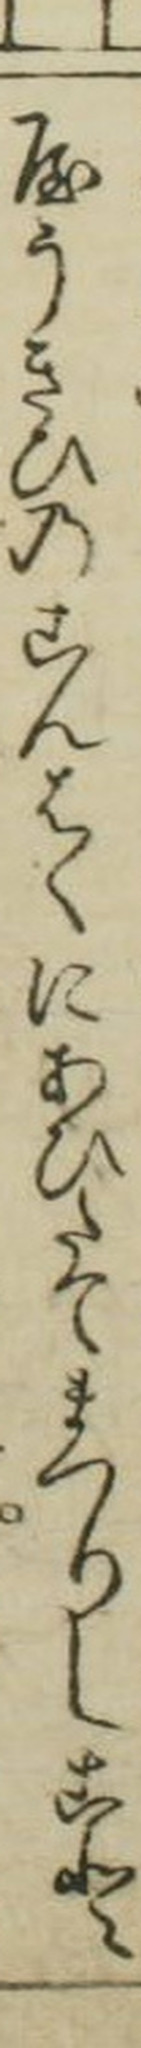やうきひのこんはくにあひたてまつりしこと
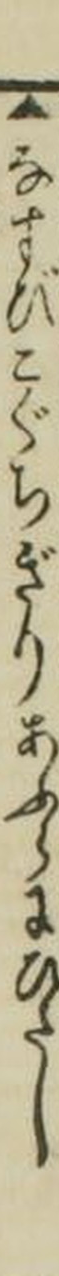▲なすびこぐちぎりあふらにひたし
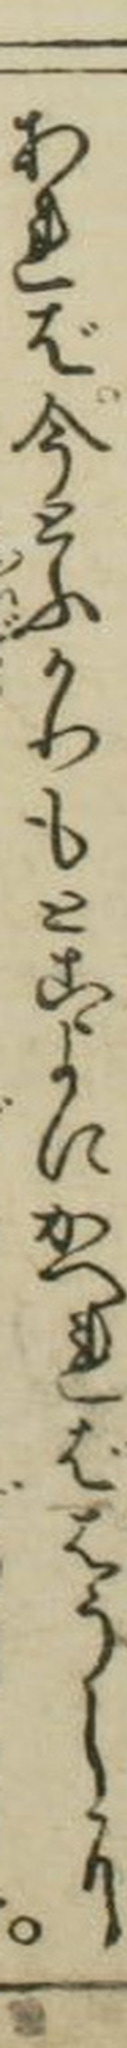あれば。今とふかりもとこよにかへれば。はうしに
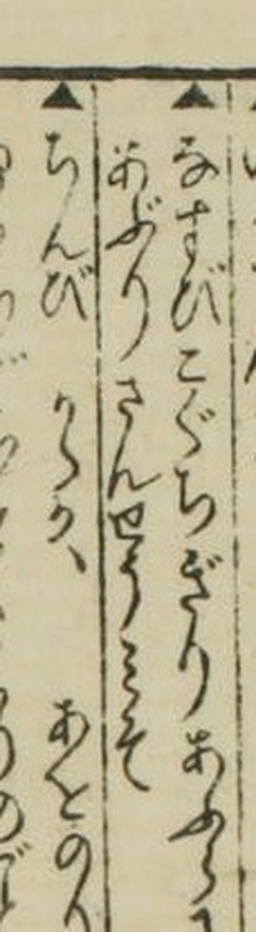あぶりさんせうみそ
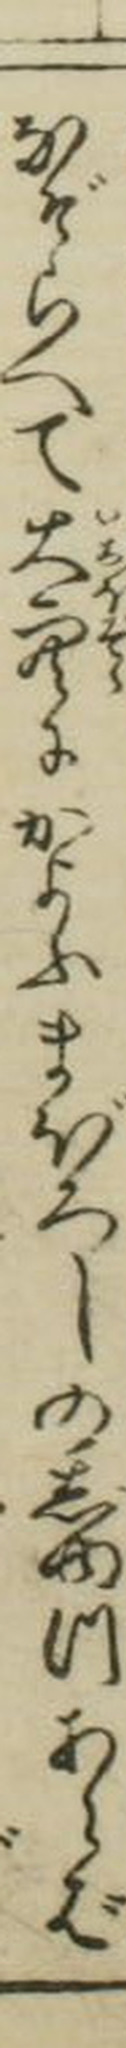なぞらへて。大空にかよふまぼろしのじゆつあらば。
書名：女源氏教訓鑑
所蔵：東京学芸大学附属図書館
